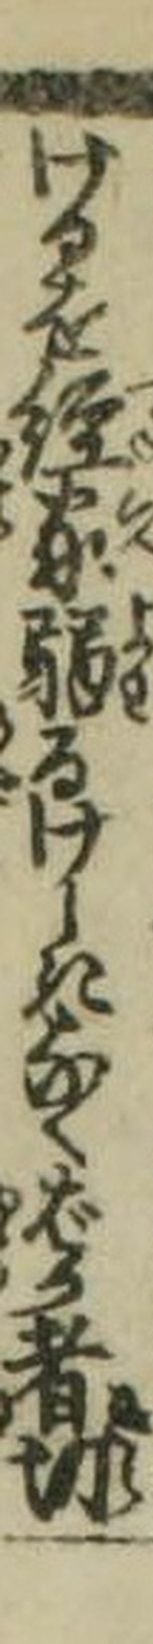けるを経家弱るけしきなくばか者切
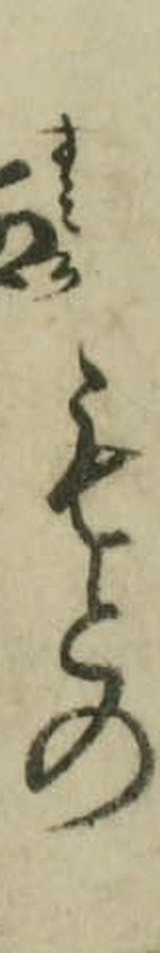もとの
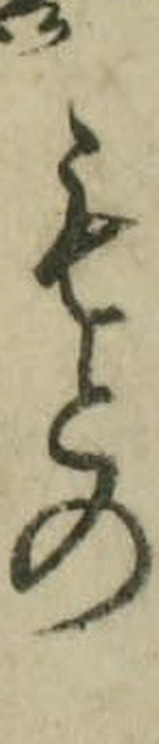もとの
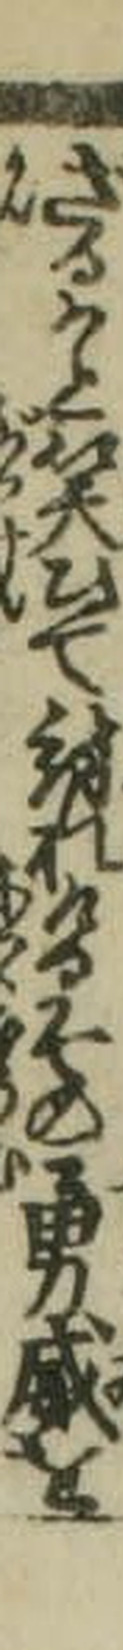ざるかと笑ひて討れけるその勇威を
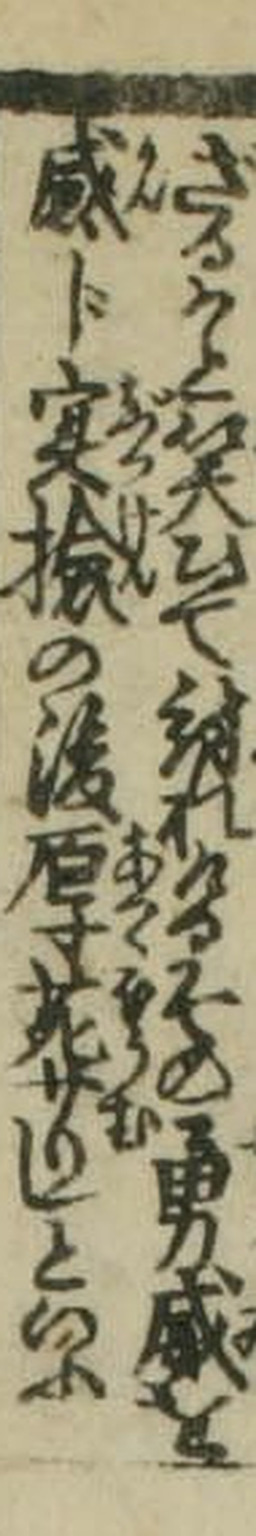感じ実検の後厚葬りしといふ
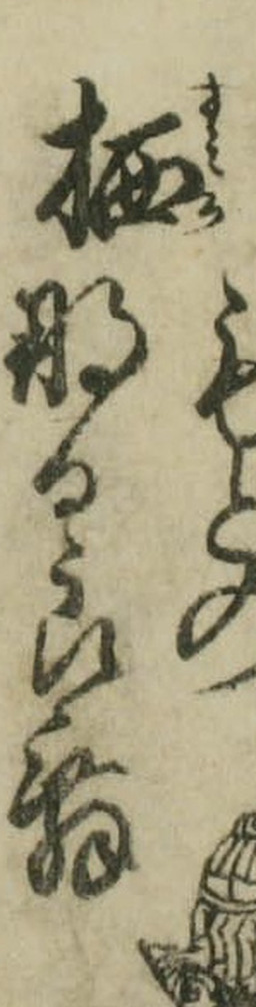栖なるらむ
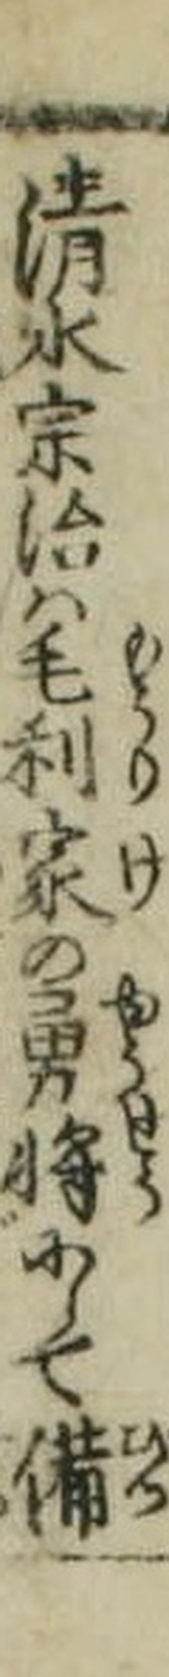清水宗治は毛利家の勇将にして備
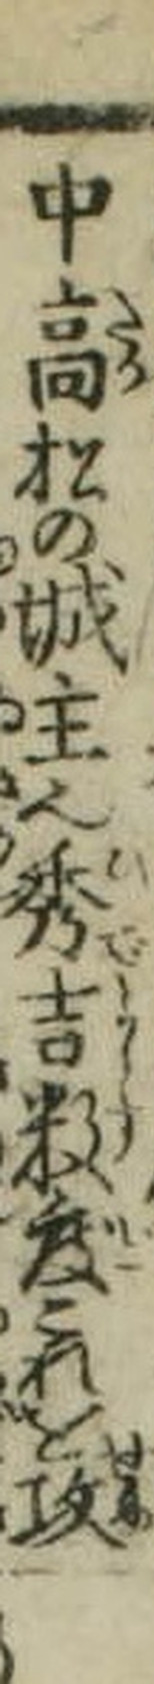中高松の城主也秀吉数度これを攻
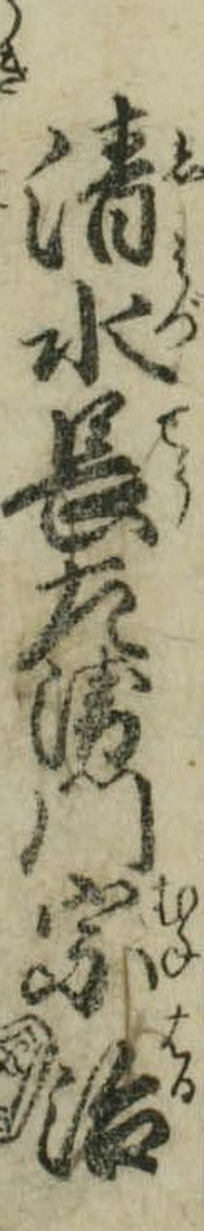清水長左衛門宗治
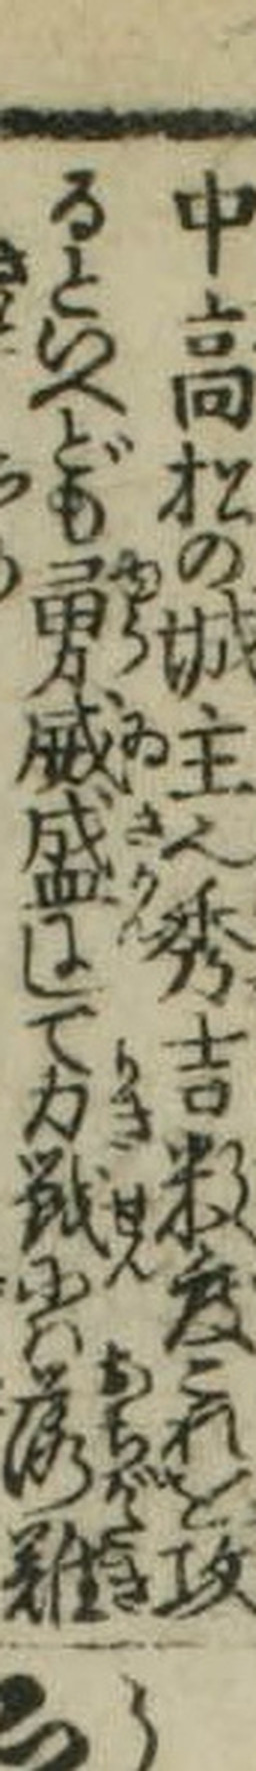るといへども勇威盛にして力戦には落難
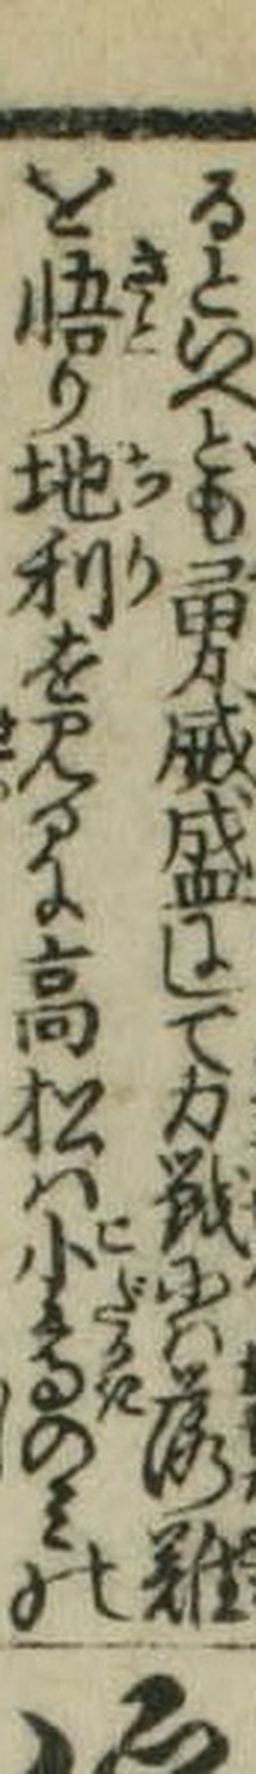を悟り地利を見るに高松は小高のみの
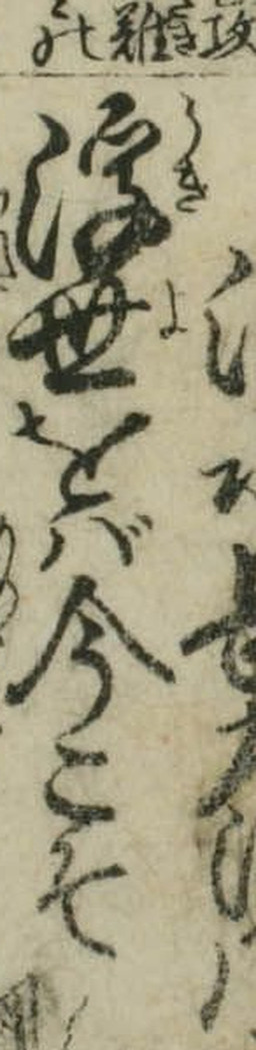浮世をば今こそ
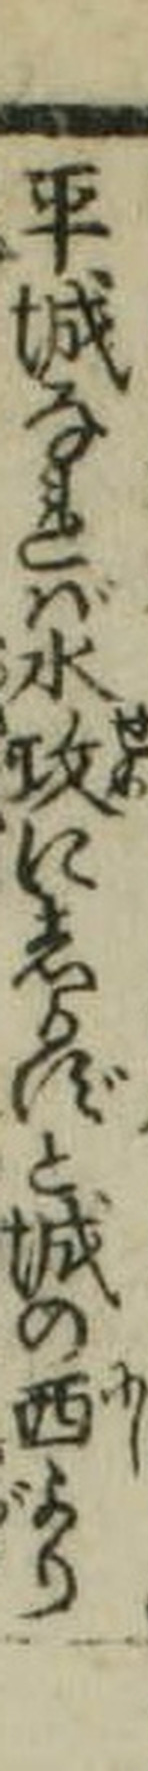平城なれば水攻にしかずと城の西より
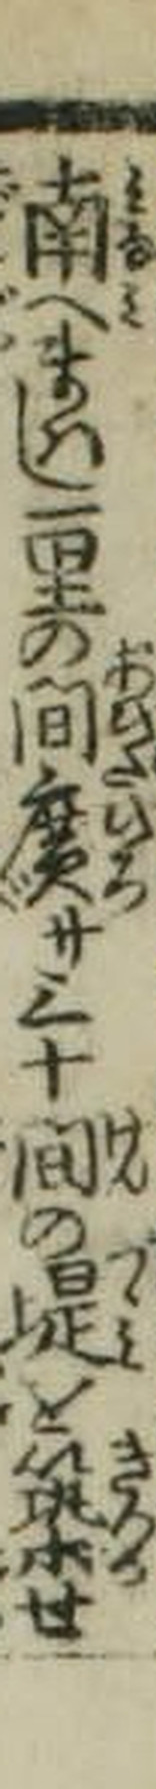南へまはし一里の間廣さ三十間の堤を築せ
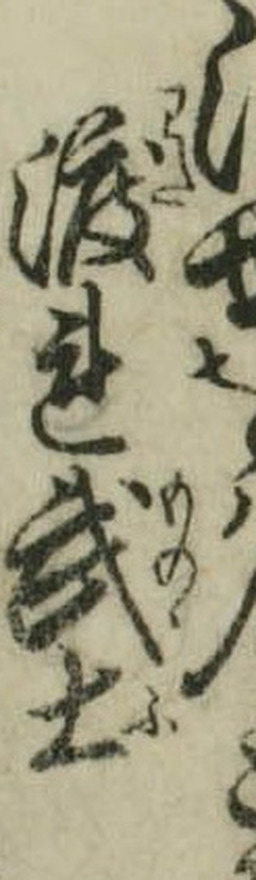渡れ武士
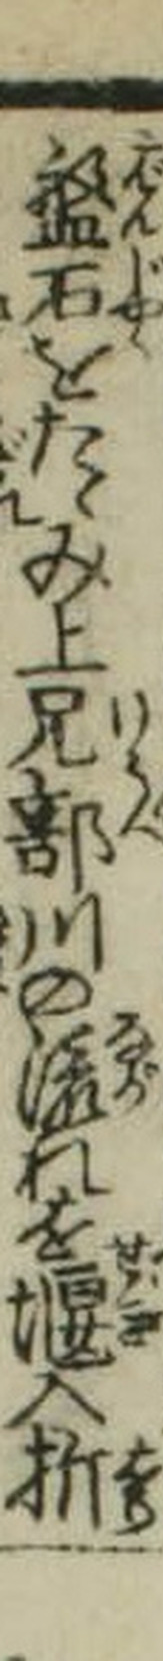盤石をたゝみ上兄上川の流れを堰入折
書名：續英雄百人一首
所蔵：東京学芸大学附属図書館
